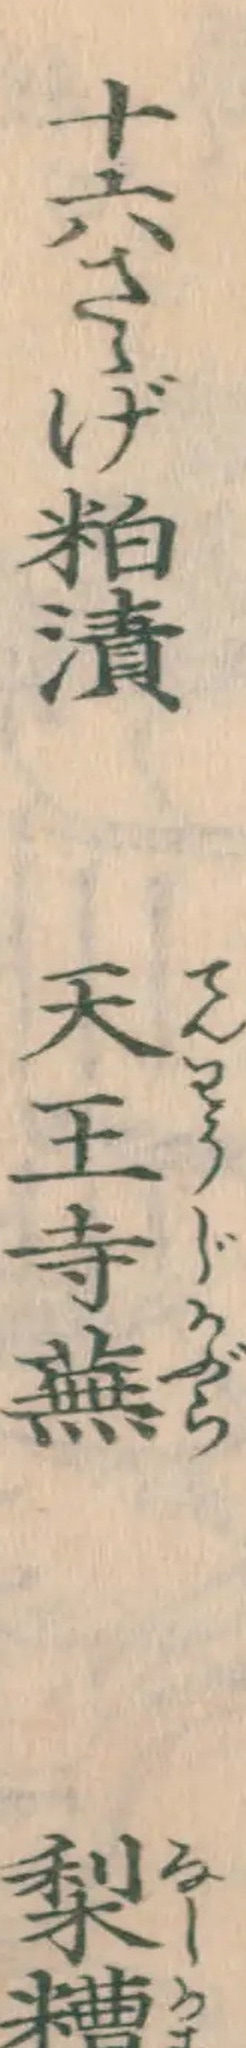十六さゝげ粕漬天王寺蕪梨糟漬
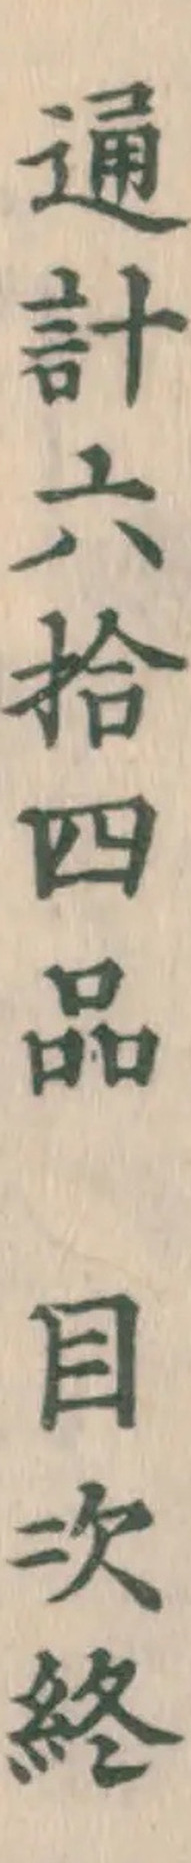通計六拾四品目次終

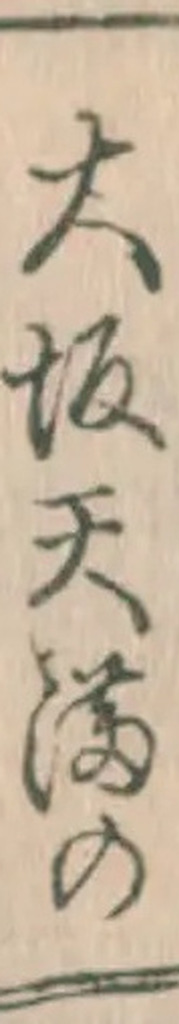大坂天満の
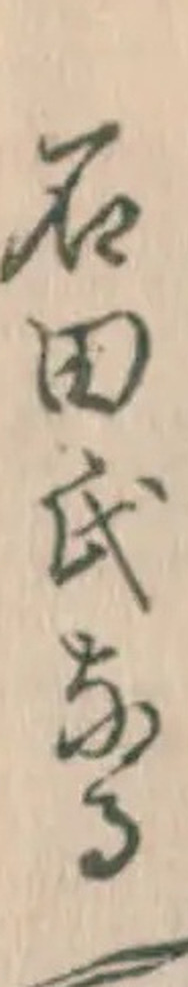石田氏なる
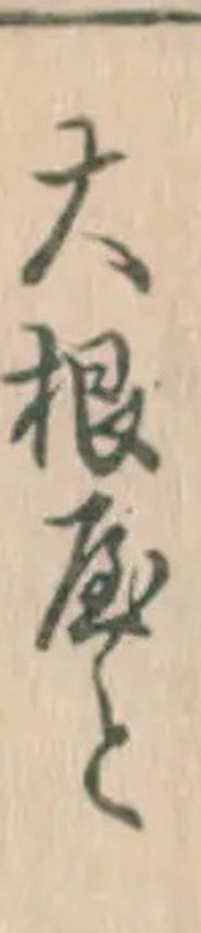大根屋と
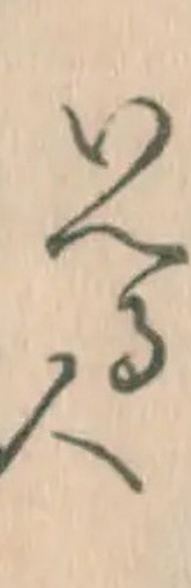いへる人
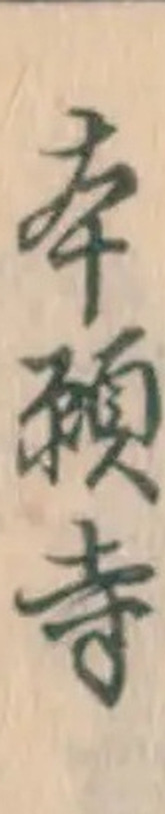本願寺
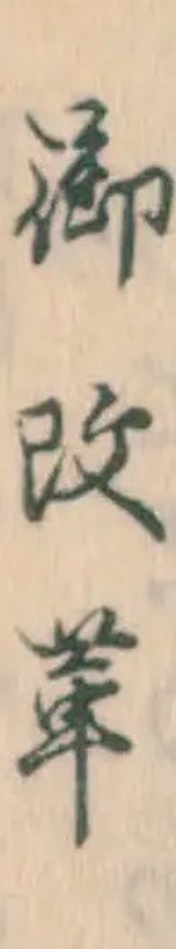御改革
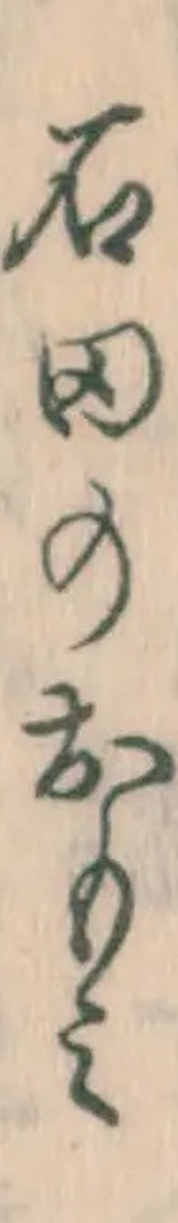石田のおもみ
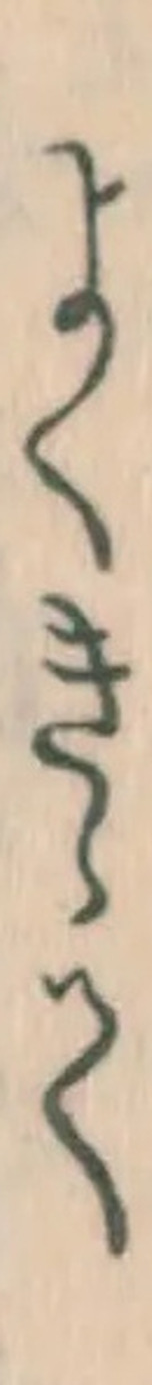よくきゝて
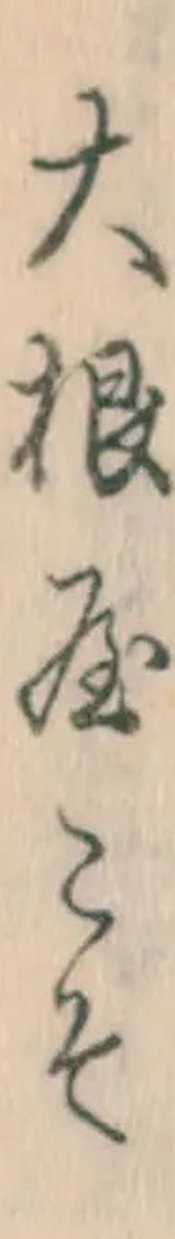大根屋こそ
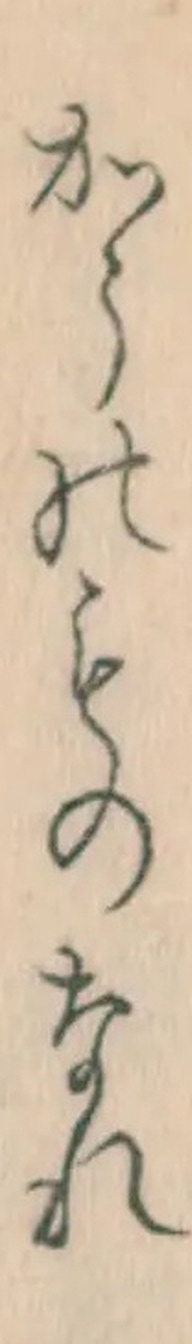かうのものなれ
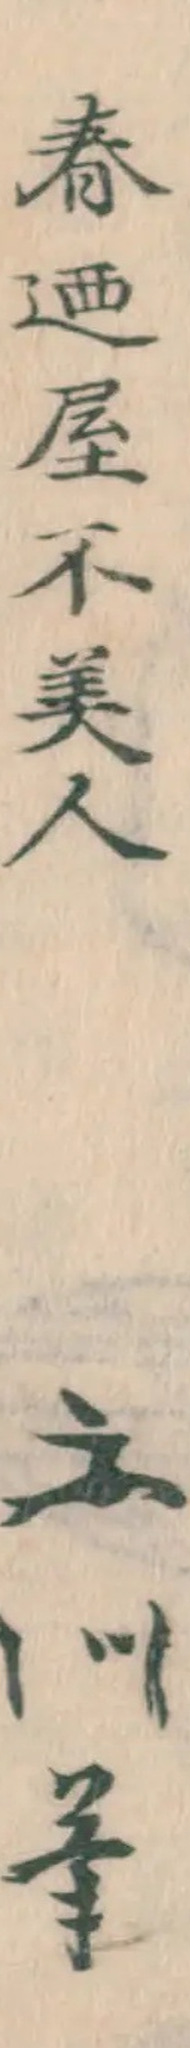春迺屋不美人文川筆

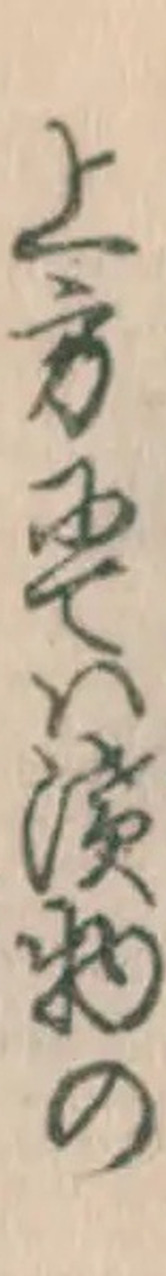上方にては漬物の
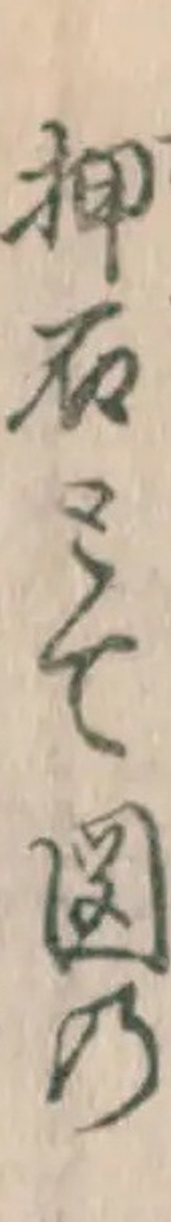押石とて図の
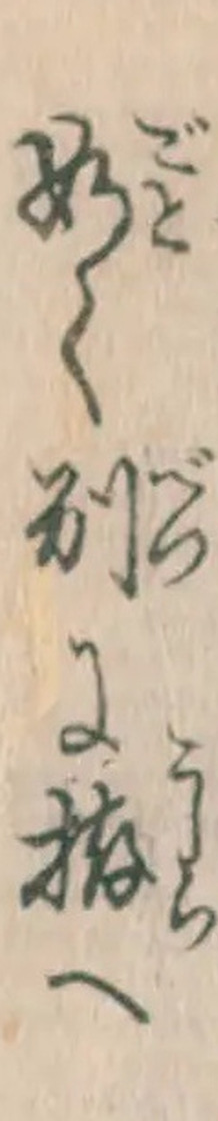如く別に拵へ
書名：四季漬物鹽嘉言
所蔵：国立国会図書館 National Diet Library, JAPAN
